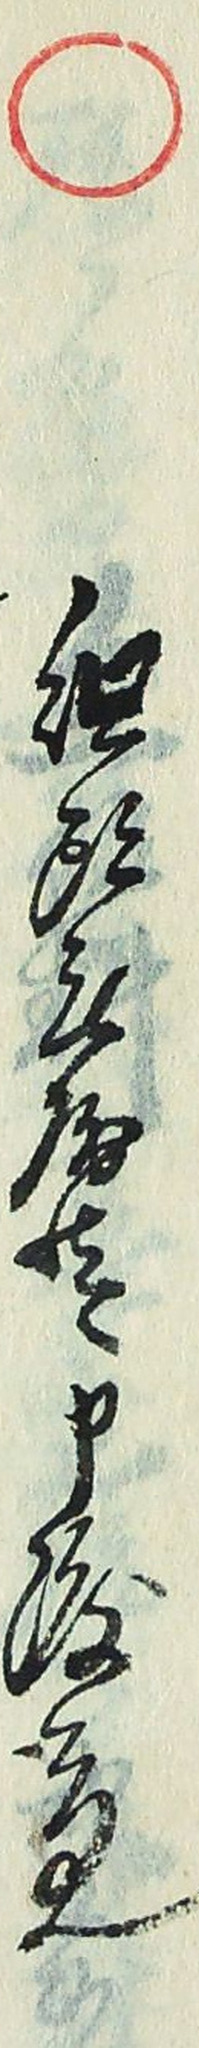○組頭庄屋共へ申渡覚
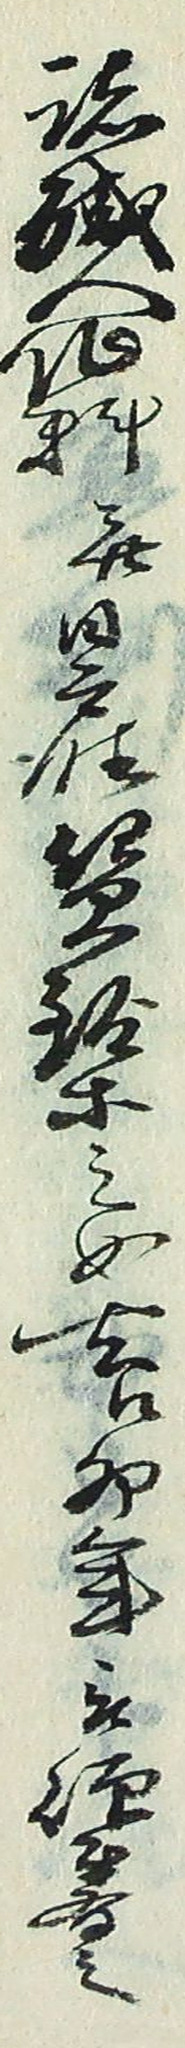諸職人作料幷日雇賃銀等之義去ル卯年被仰付有之
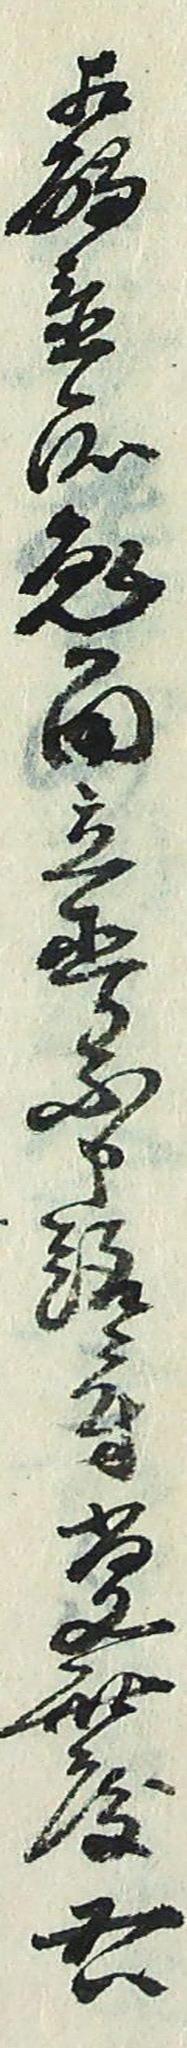相觸置候所兎角立直り不申趣ニ付尚又此度右
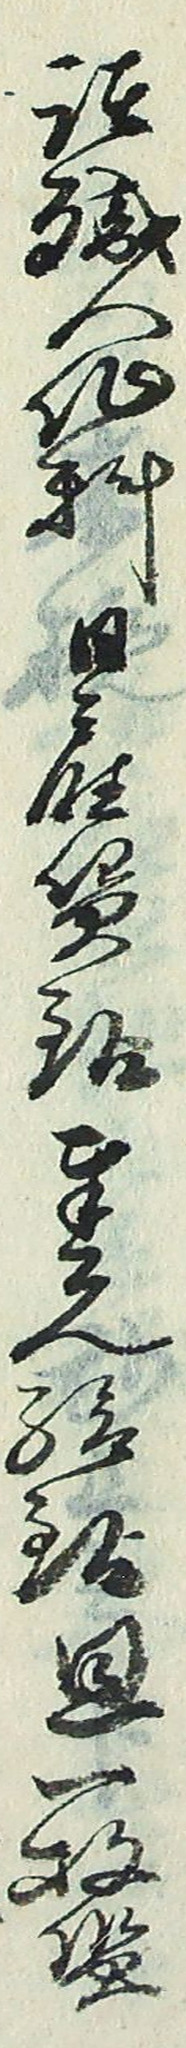諸職人作料日雇賃銀奉公人給銀且一牧質
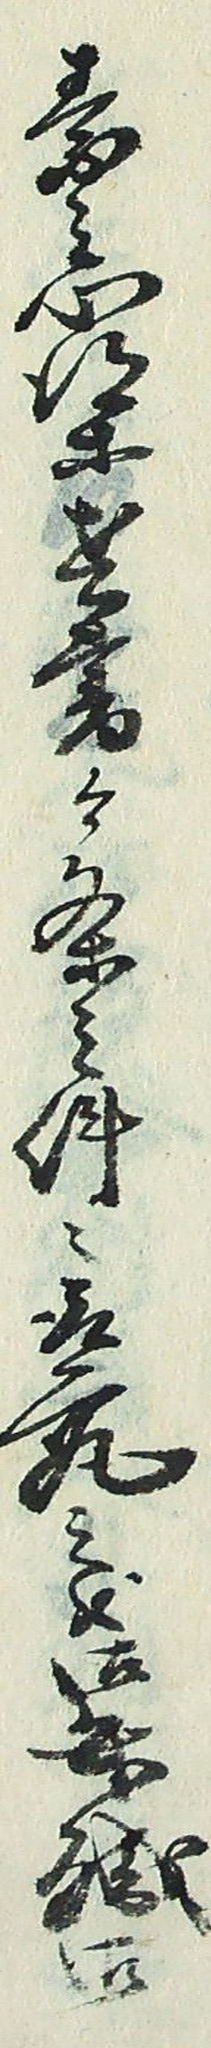素之心得等左書ケ条之件々取究之義御當職御
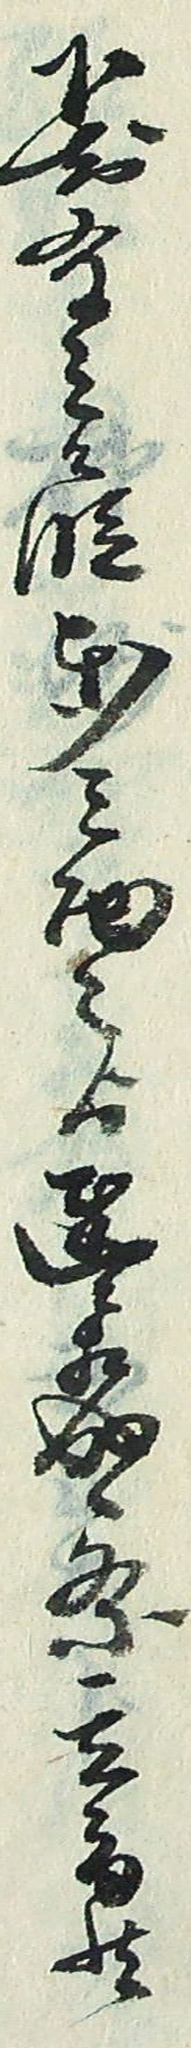下知有之候段本〆之面々ゟ達ニ相成候条其方共
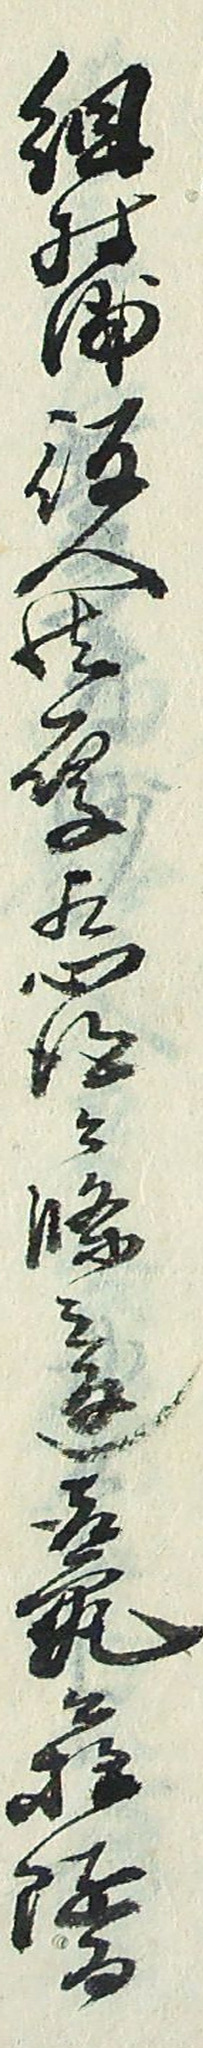組村浦役人共厚相心得ケ條之通取究候様随而
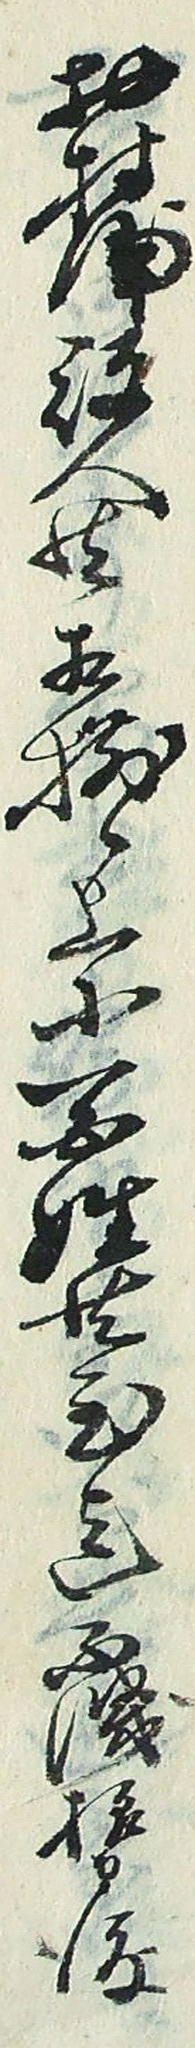於村浦役人共相揃候上小百姓共至迄不洩様申渡

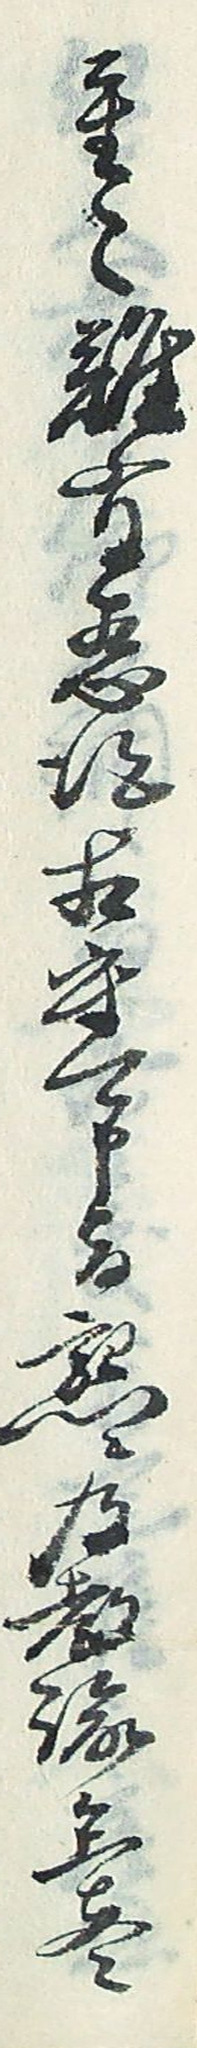重々難有相心得相守可申旨懇ニ及教諭候上夫々
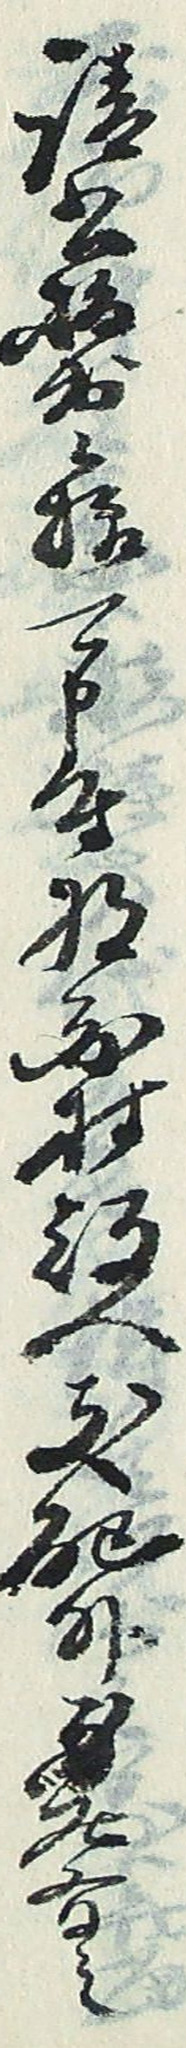請書指出候様可申付猶亦村役人支配外身居有之
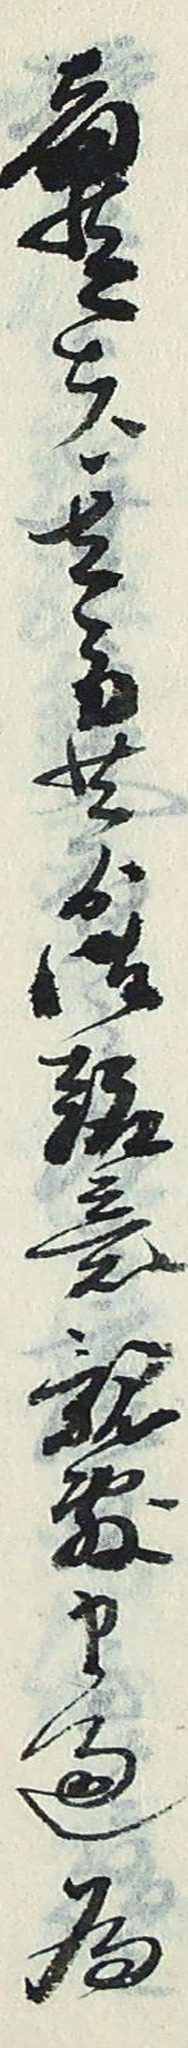者共ニ者其方共ゟ御趣意親敷申通為
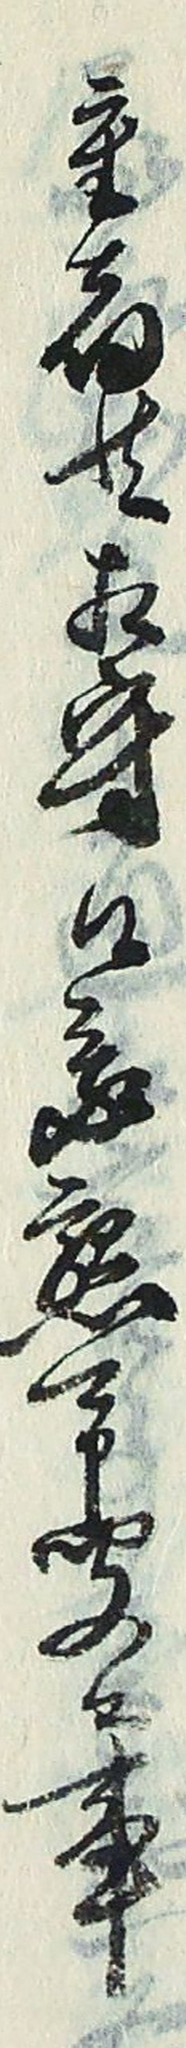重者共相守候義懇可申聞候事
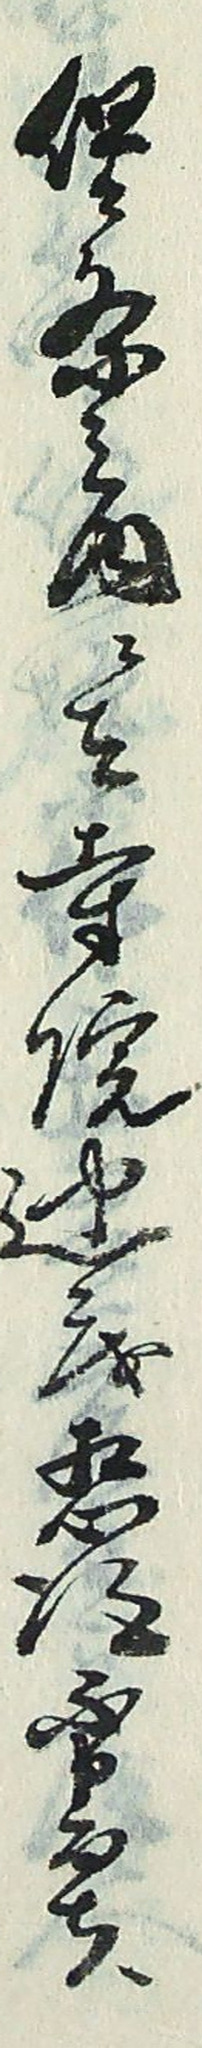但ケ条之内ニ者寺院迚も相心得不申而者
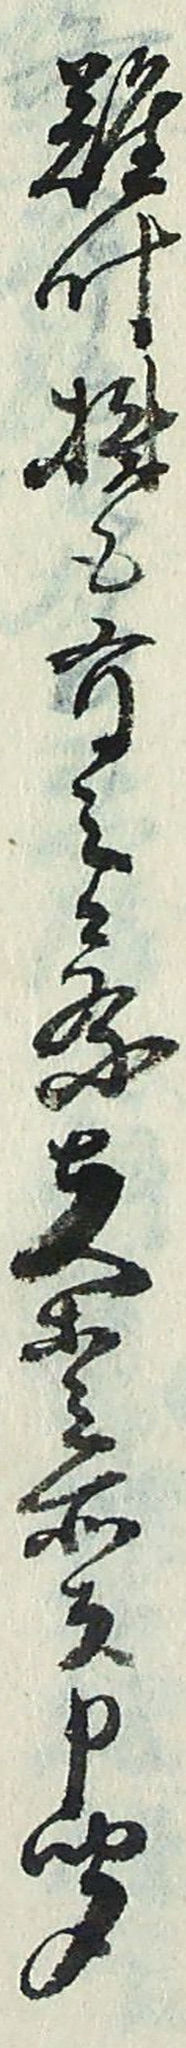難叶機も有之候条夫等之所者申聞
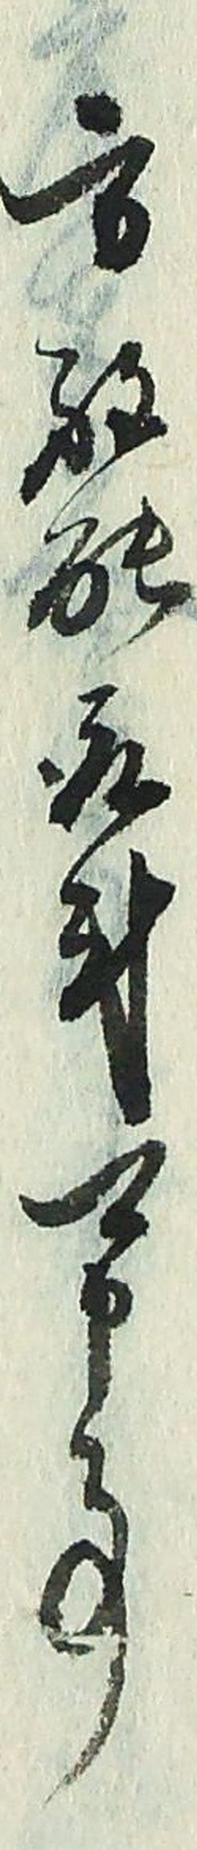方程能取計可申事
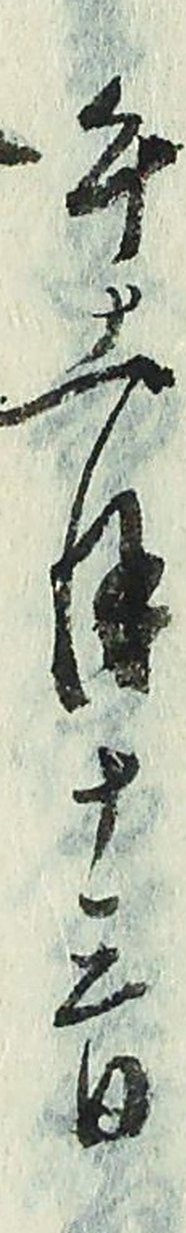午十一月十三日
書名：諸御趣意書并御下知向之写
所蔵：鳴門教育大学 Naruto University of Education
